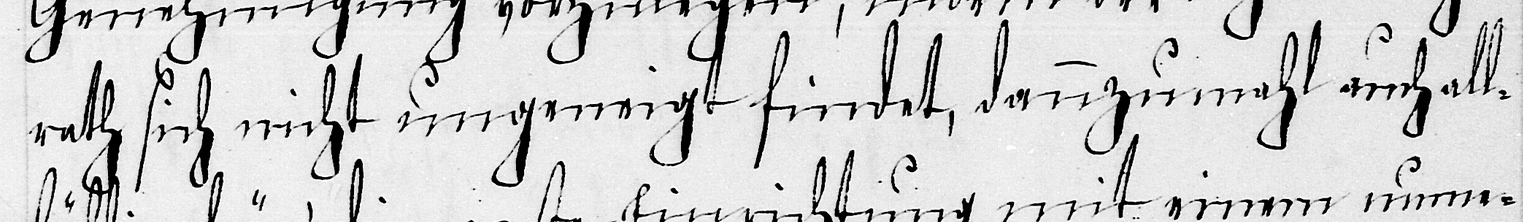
rath sich nicht ungeneigt findet, dannzumahl auch al¬
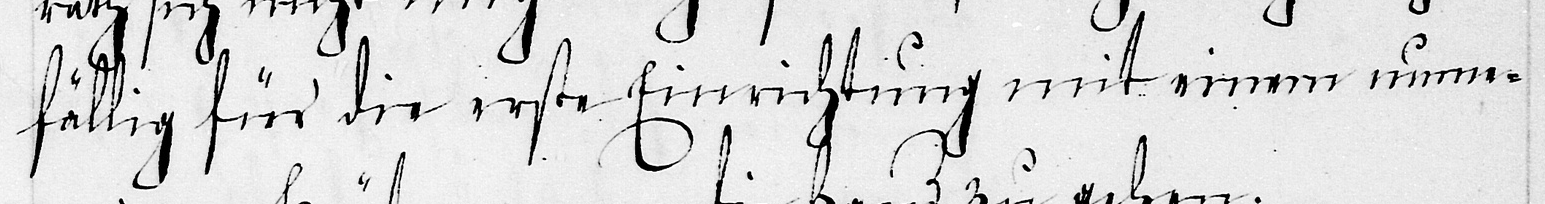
lfällig für die erste Einrichtung mit einem nume¬
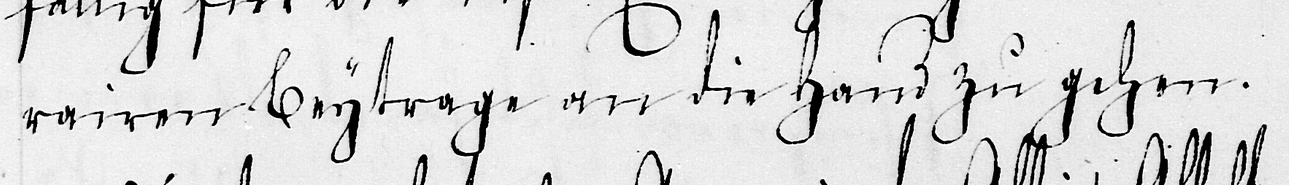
rairen Beytrage an die Hand zu gehen.
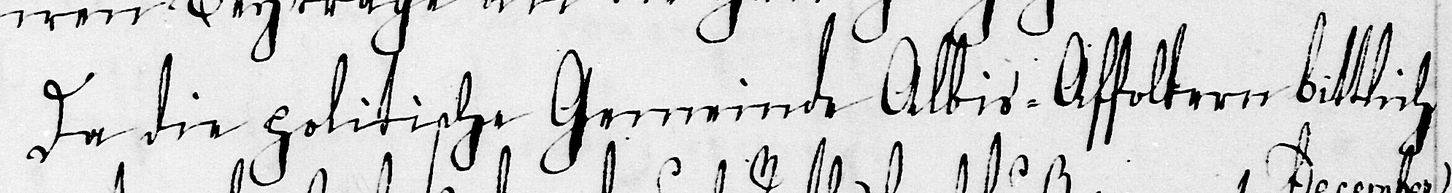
Da die politische Gemeinde Albis-Affoltern bittli¬
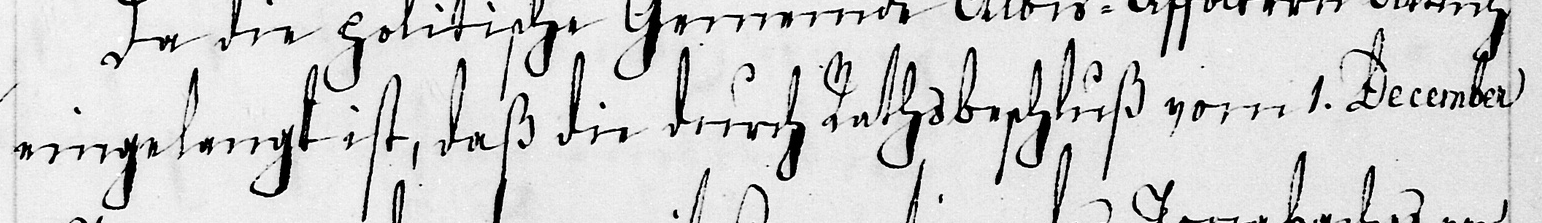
eingelangt ist, daß die durch Rathsbeschluß vom 1. December
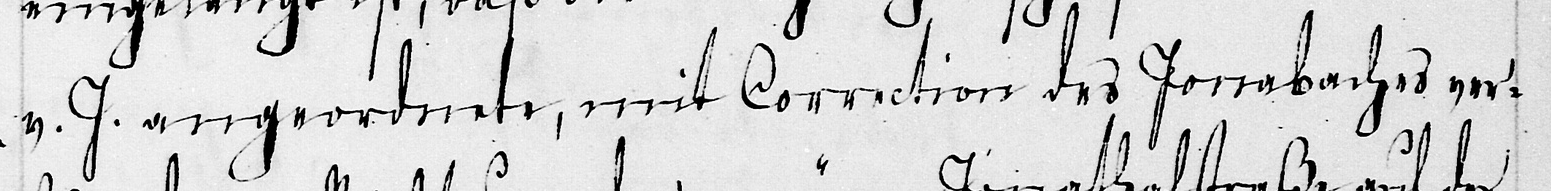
v. J. angeordnete, mit Correction des Jonabaches ver¬
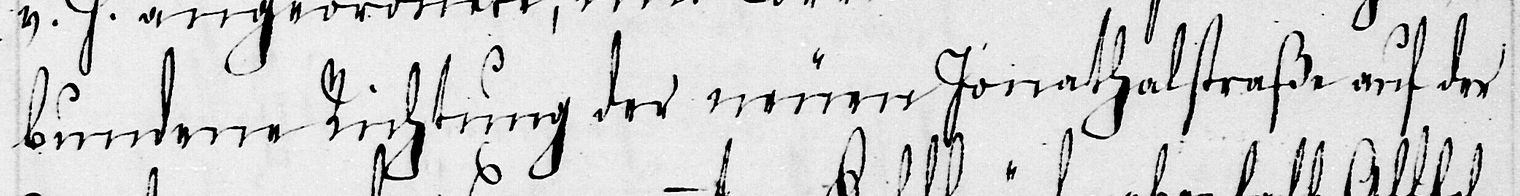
bundene Richtung der neuen Jonathalstraße auf der
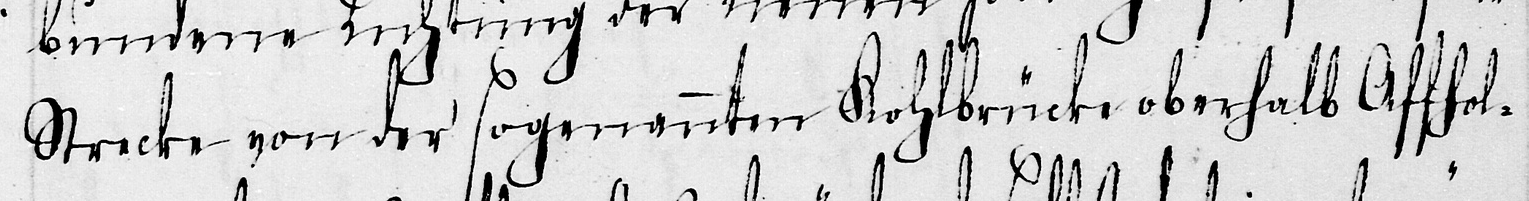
Strecke von der sogenannten Kohlbrücke oberhalb Affhol¬
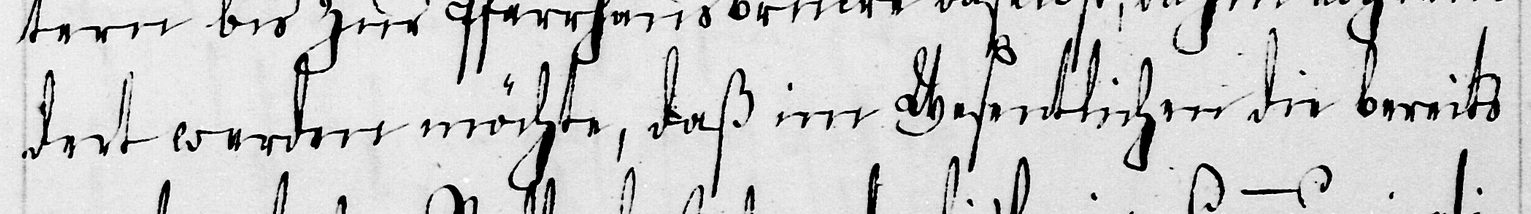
dert werden möchte, daß im Wesentlichen die bereits
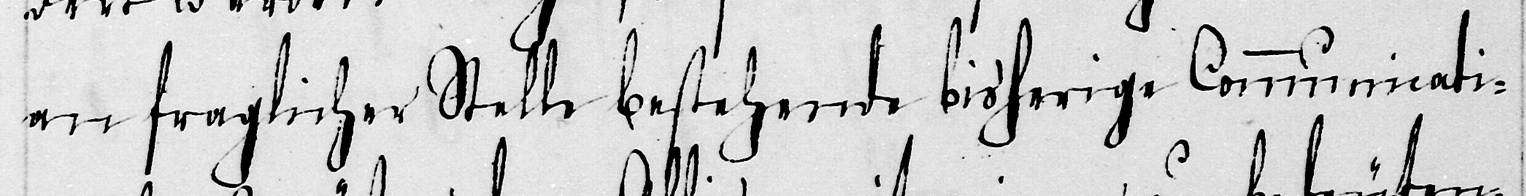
an fraglicher Stelle bestehende bisherige Communicati¬
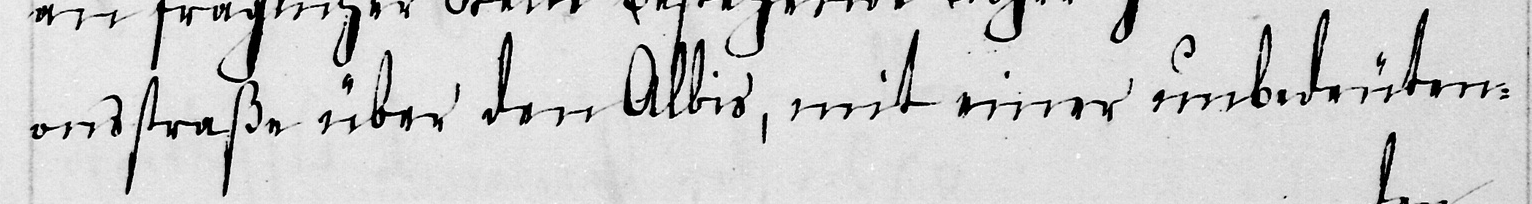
onsstraße über den Albis, mit einer unbedeuten-
